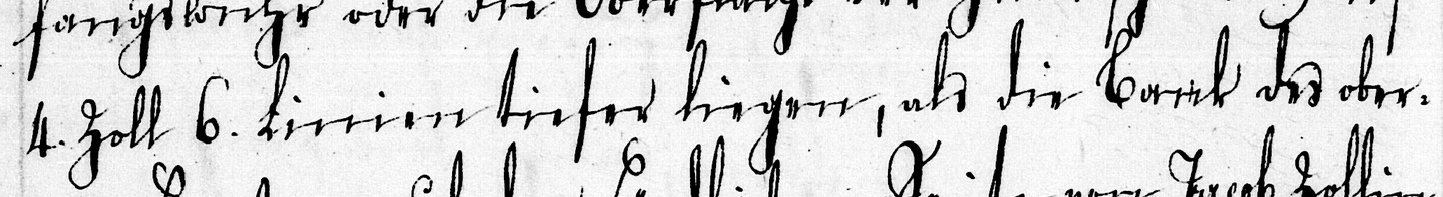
4. Zoll 6. Linien tiefer liegen, als die Bank des ober¬
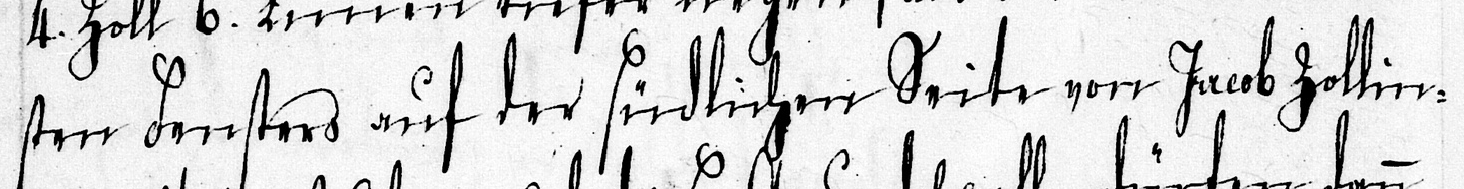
sten Fensters auf der südlichen Seite von Jacob Zollin¬
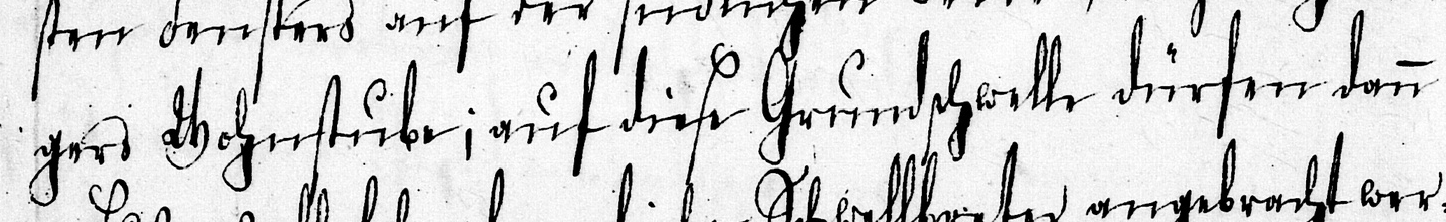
gers Wohnstube; auf diese Grundschwelle dürfen dann
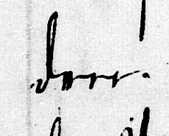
den.
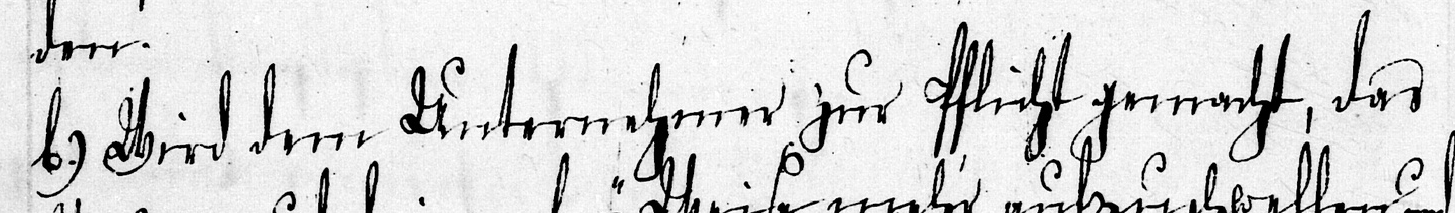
b.) Wird dem Unternehmer zur Pflicht gemacht, das
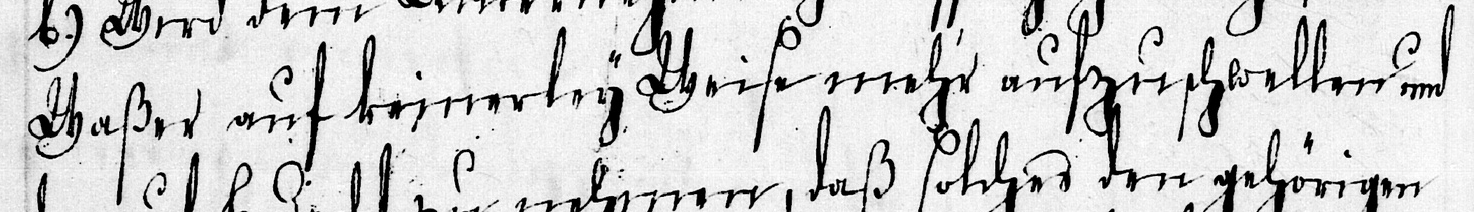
Waßer auf keinerley Weise mehr aufzuschwellen und
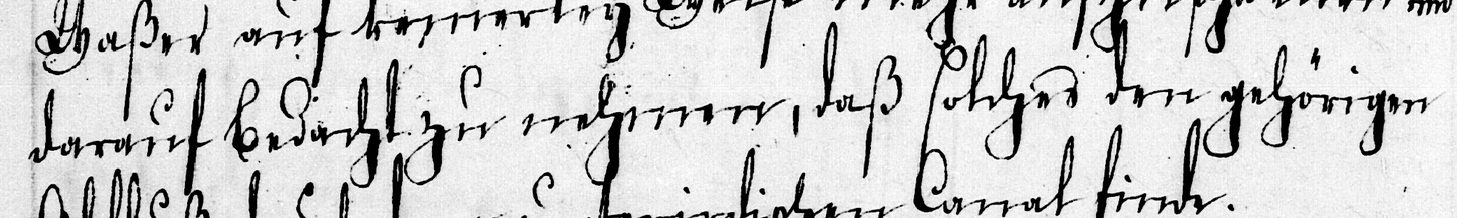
darauf Bedacht zu nehmen, daß solches den gehörigen
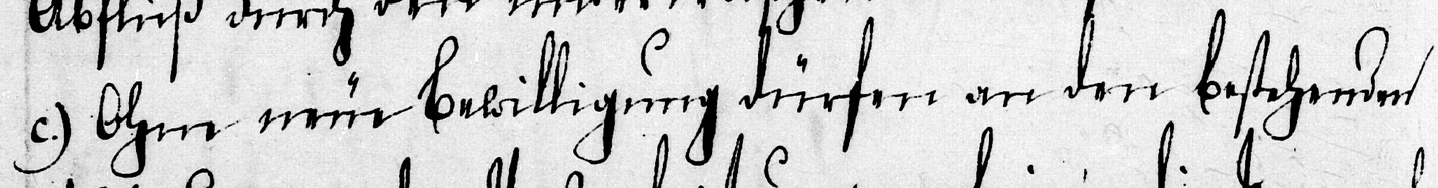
c.) Ohne neue Bewilligung dürfen an den bestehenden
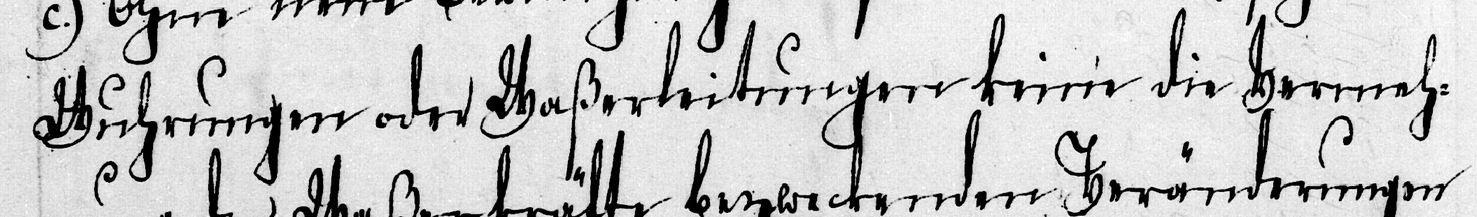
Wuhrungen oder Waßerleitungen keine die Vermeh¬
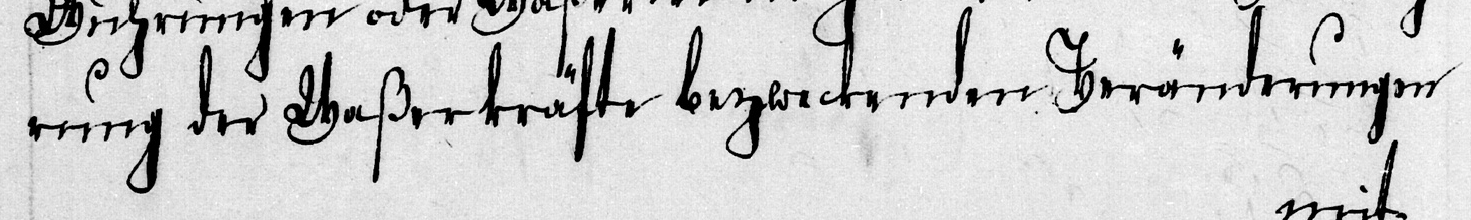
rung der Waßerkräfte bezweckenden Veränderungen
